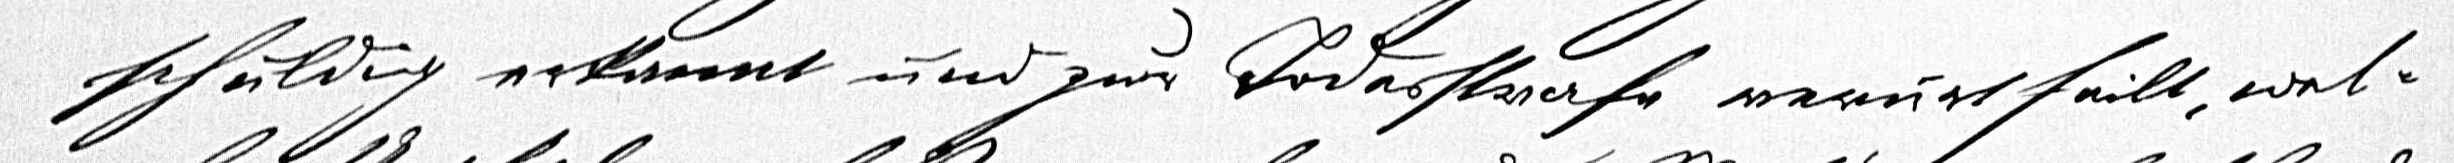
schuldig erkannt und zur Todesstrafe verurtheilt, wel¬
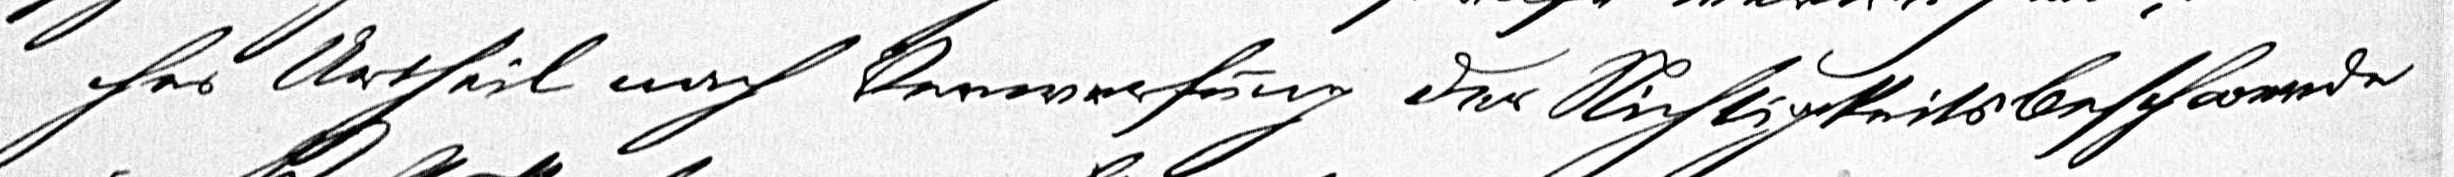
ches Urtheil nach Verwerfung der Nichtigkeitsbeschwerde
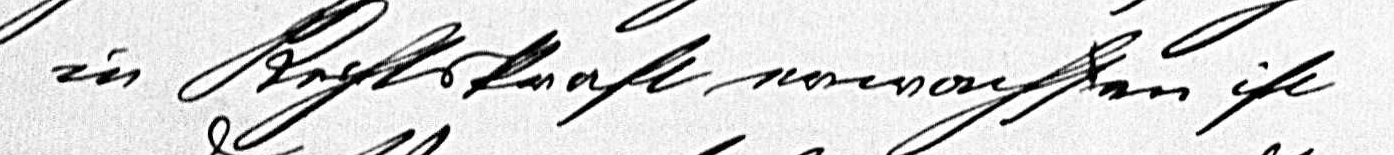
in Rechtskraft erwachsen ist.
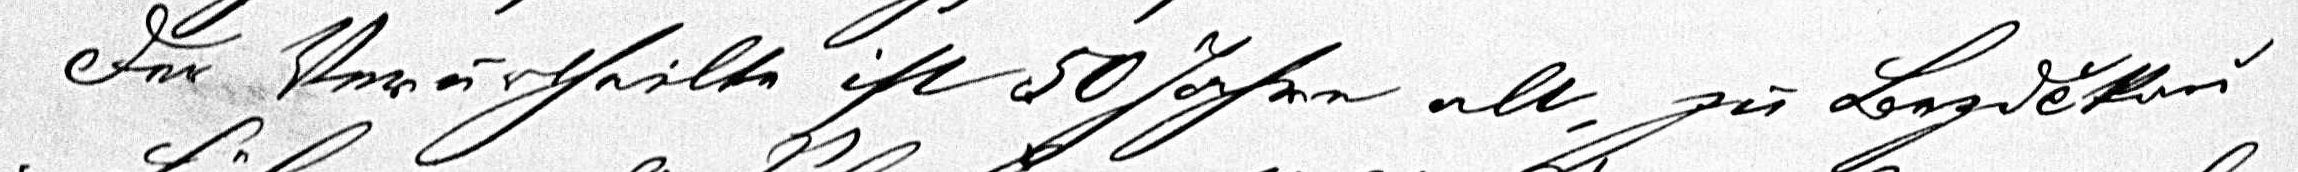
Der Verurtheilte ist 50 Jahre alt, zu Bezděkau
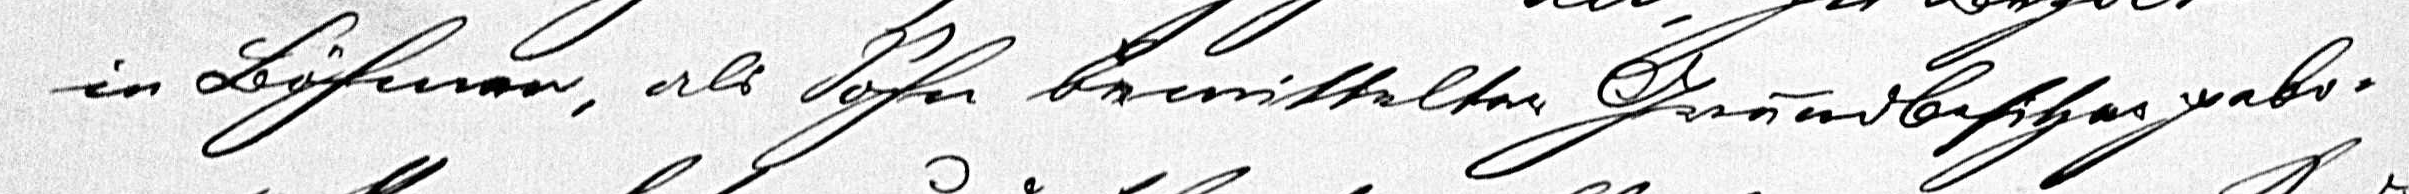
in Böhmen, als Sohn bemittelter Grundbesitzer gebo¬
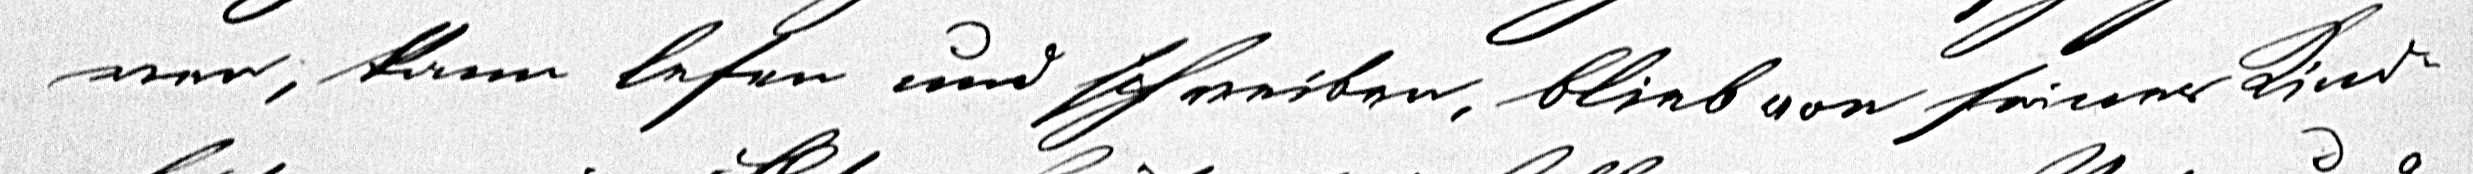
ren; kann lesen und schreiben, blieb von seiner Kind¬
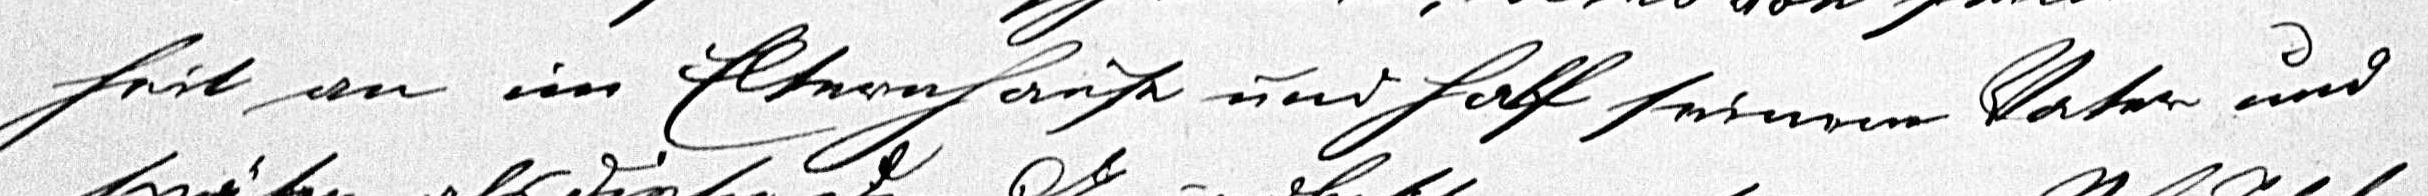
heit an im Elternhause und half seinem Vater und
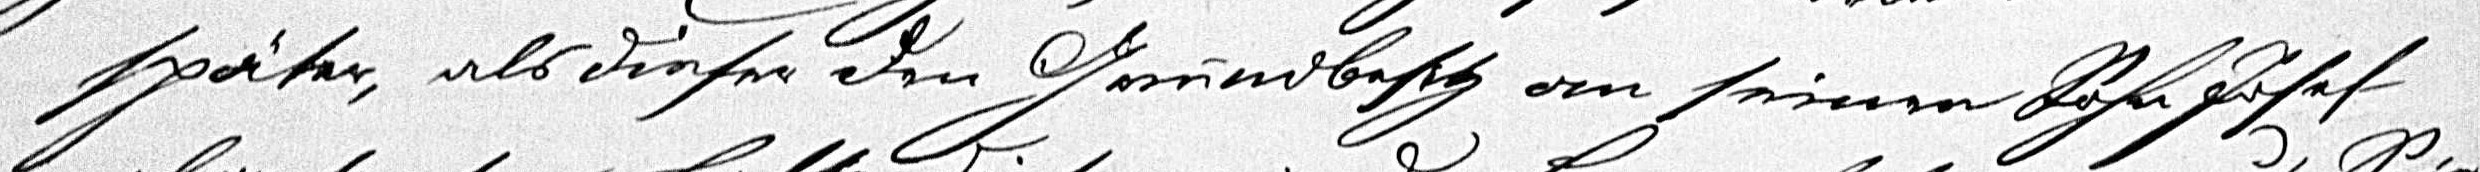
später, als dieser den Grundbesitz am seiner Sohn Josef
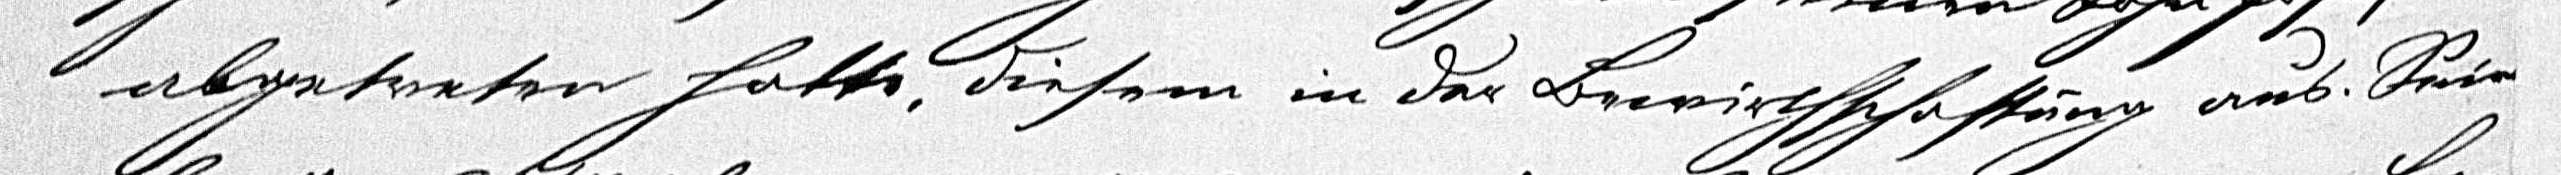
abgetreten hatte, diesem in der Bewirthschaffung aus. Sein
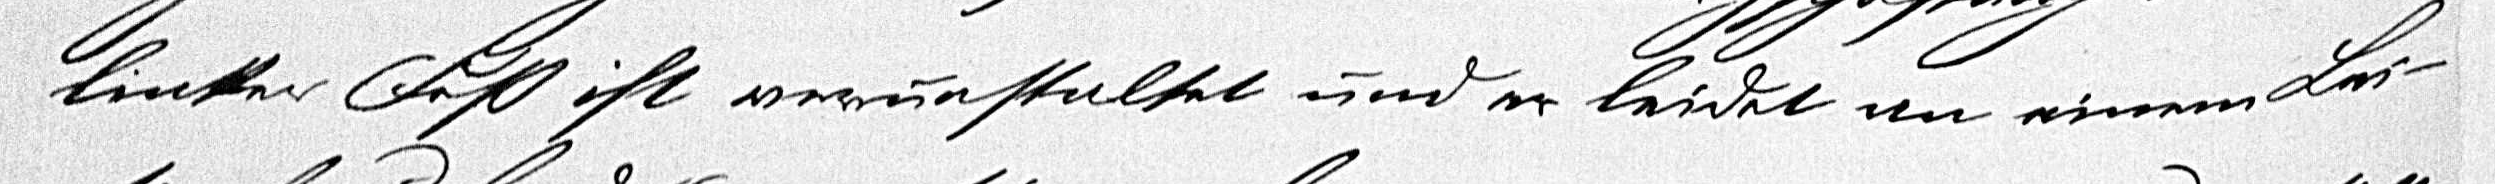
linker Fuß ist verunstaltet und er leidet an einem Lei¬
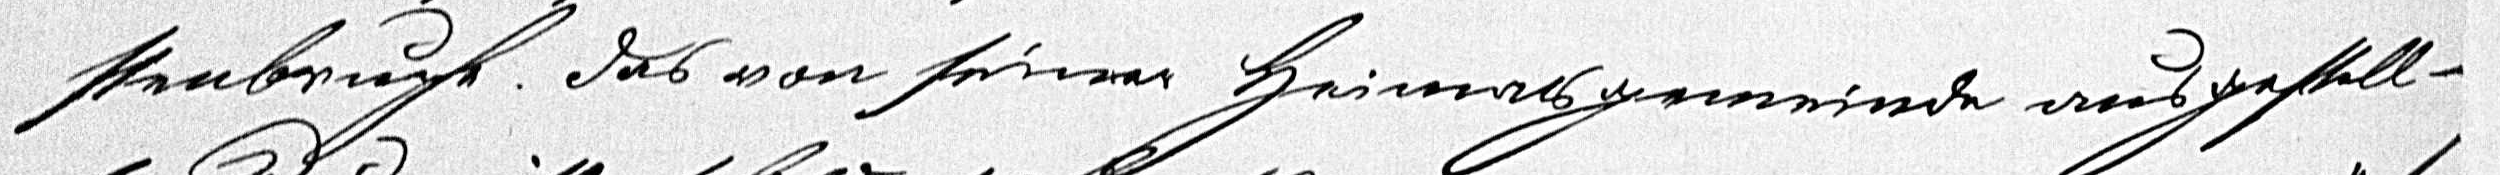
stenbruche. Das von seiner Heimatsgemeinde ausgestell¬
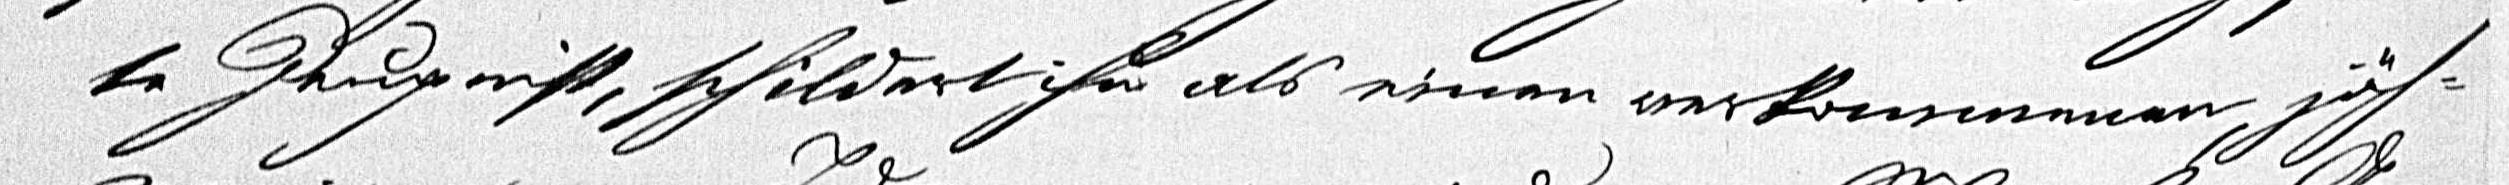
te Zeugniß, schildert ihn als einen verkommenen jäh¬
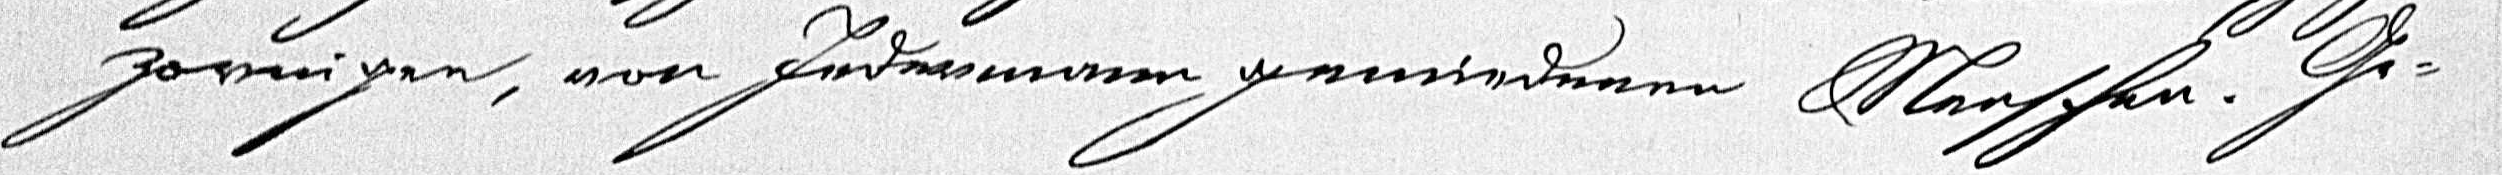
zorniger, von Jedermann gemiedenen Menschen. Ge¬
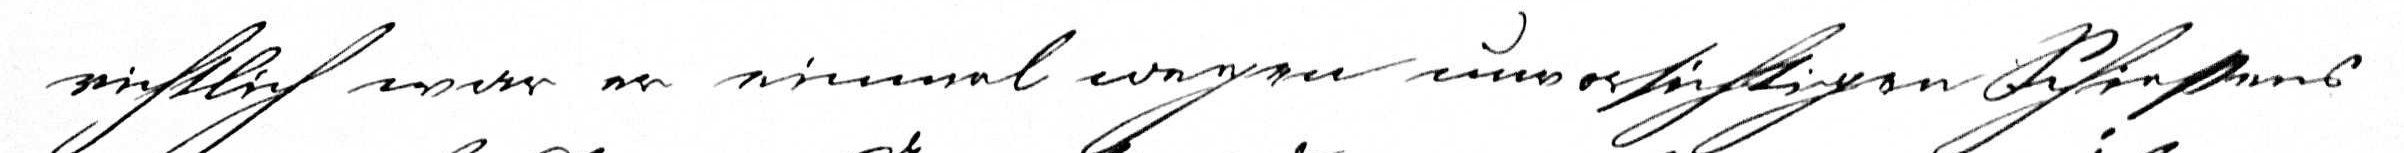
richtlich war er einmal wegen unvorsichtigen Schießens
